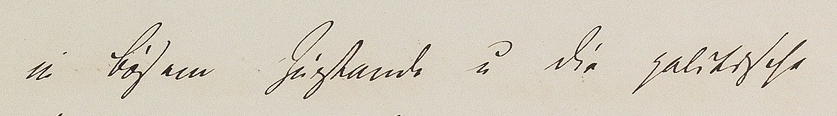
in bösem Zustande u die politische
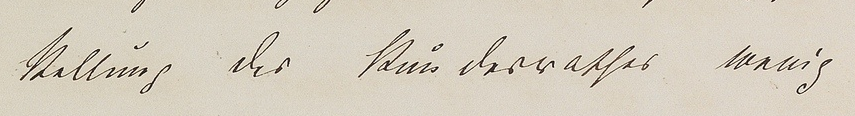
Stellung des Bundesrathes wenig
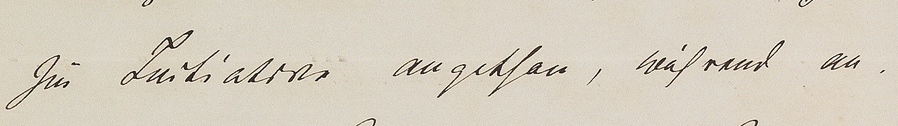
zur Initiative angethan, während an-
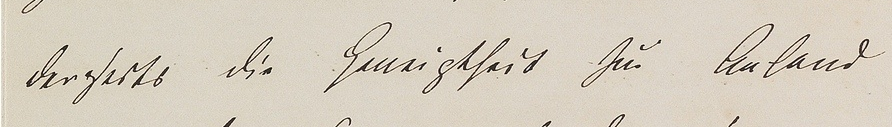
derseits die Geneigtheit zur Anhand-
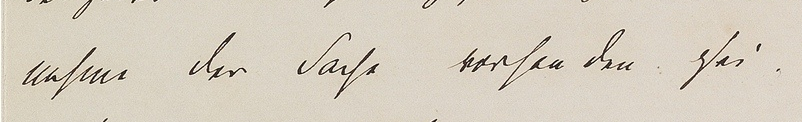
nahme der Sache vorhanden sei.
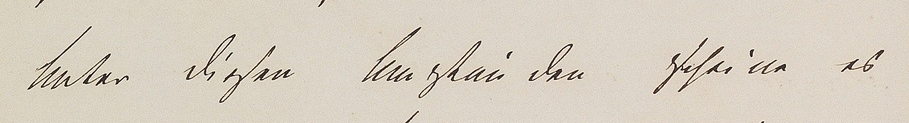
Unter diesen Umständen scheine es
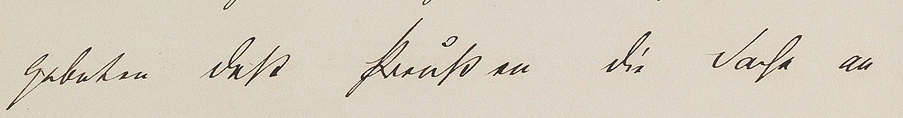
geboten daß Preußen die Sache an
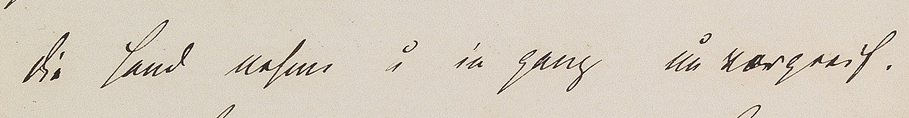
die Hand nehme u in ganz unvorgreif-
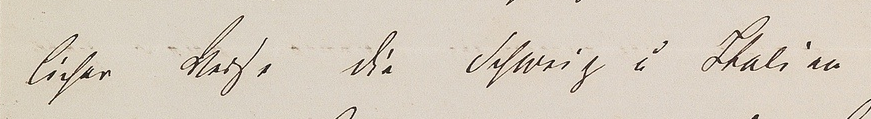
licher Weise die Schweiz u Italien
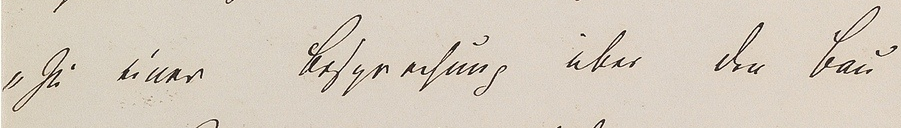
«zu einer Besprechung über den Bau
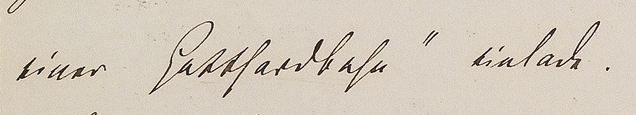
einer Gotthardbahn» einlade.
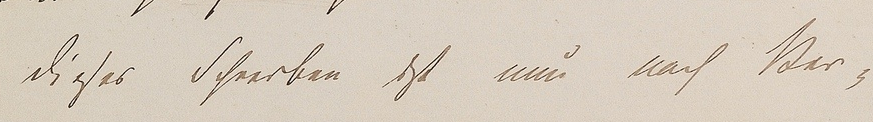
Dieses Schreiben ist nun nach Ber-
